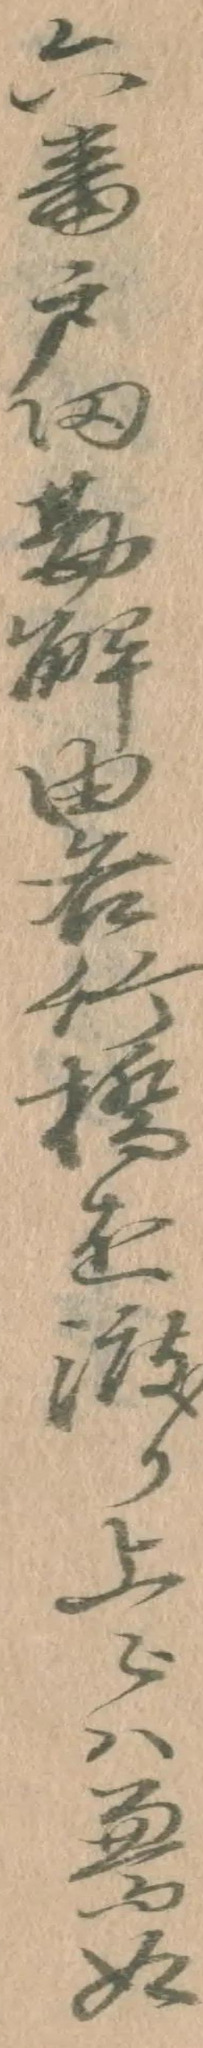六番戸田勘解由各竹橋を渡り上らは兼而如
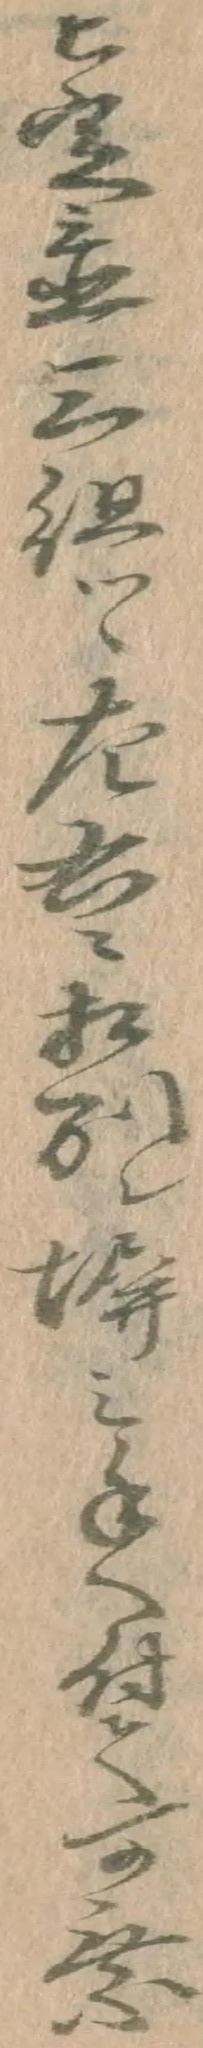被定置三組つゝ左右に相別し塀之手へ付て可乗
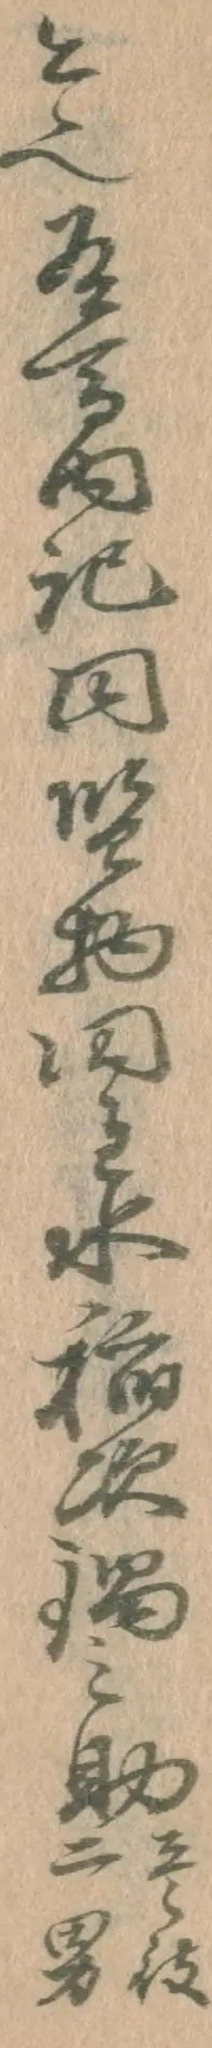と也有馬内記同監物同主水稲次鍋之助壱岐二男
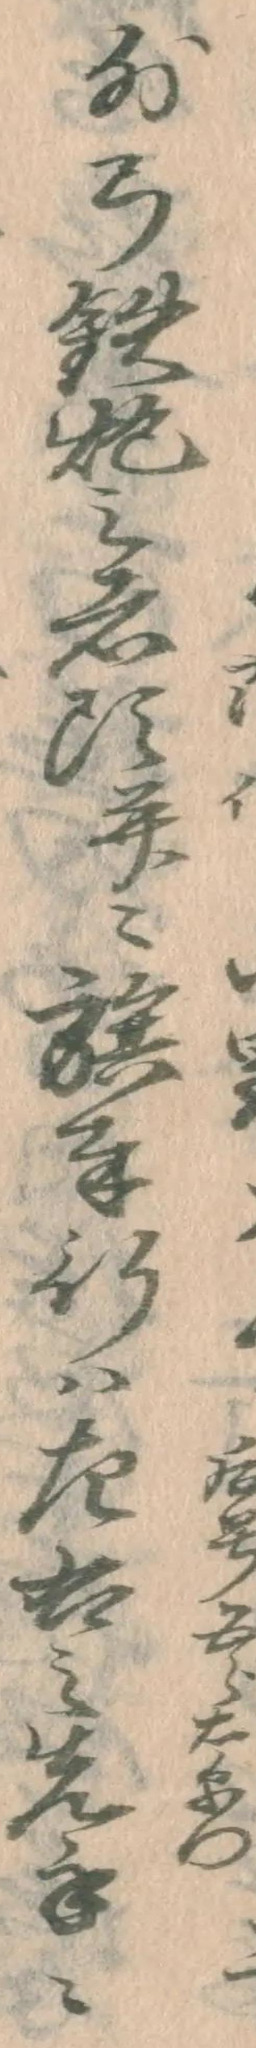外弓鉄炮之者頭幷に旗奉行は左右之先手に
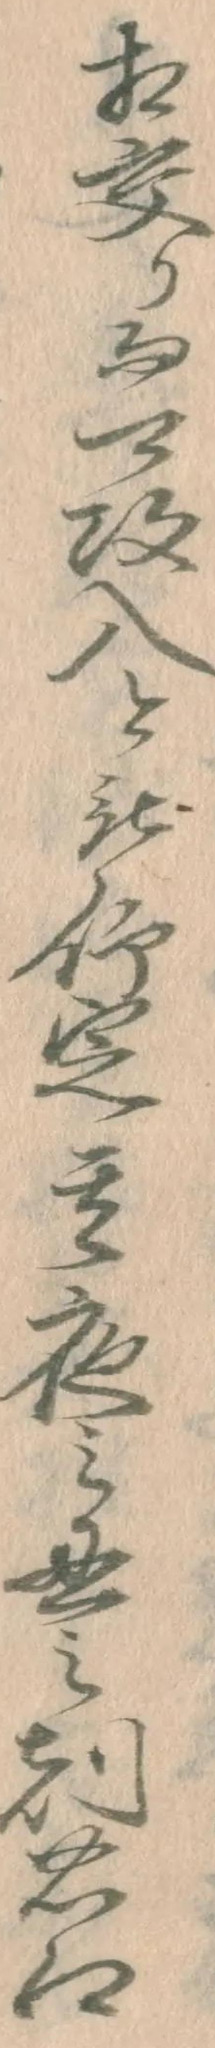相交り而可攻入と被仰定其夜之丑之刻忠郷
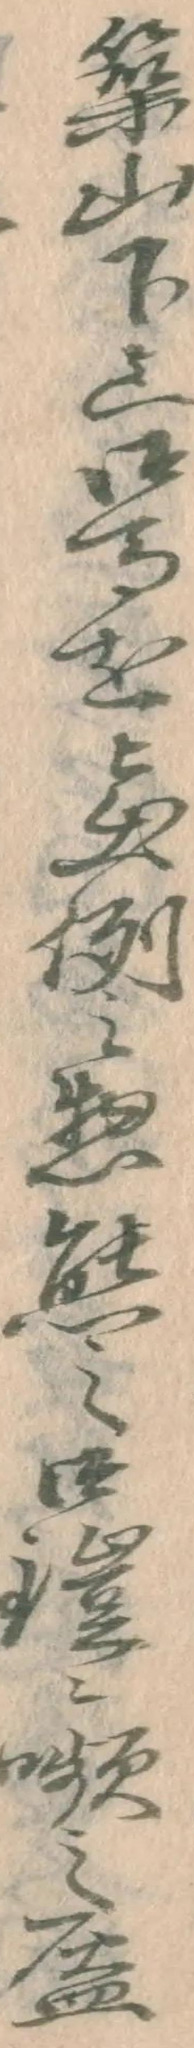築山下迄御馬を被出例に惣熊之御鎧に嚬之盔
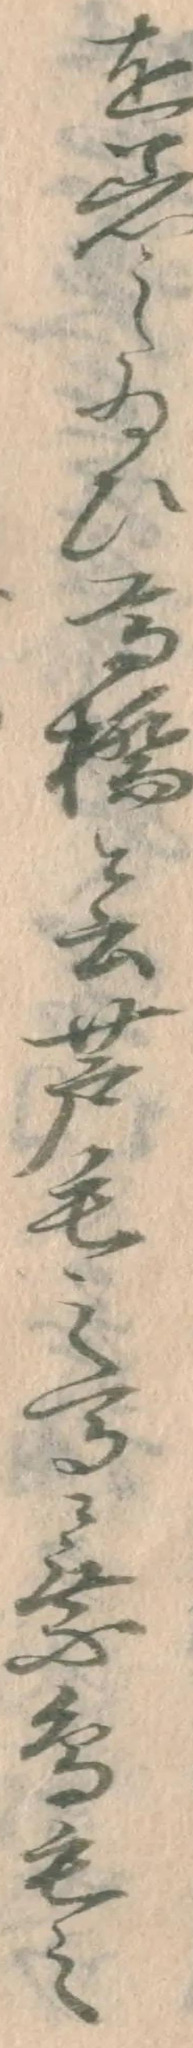を着しゐひ高橋と云芦毛之馬に乗鳥毛之
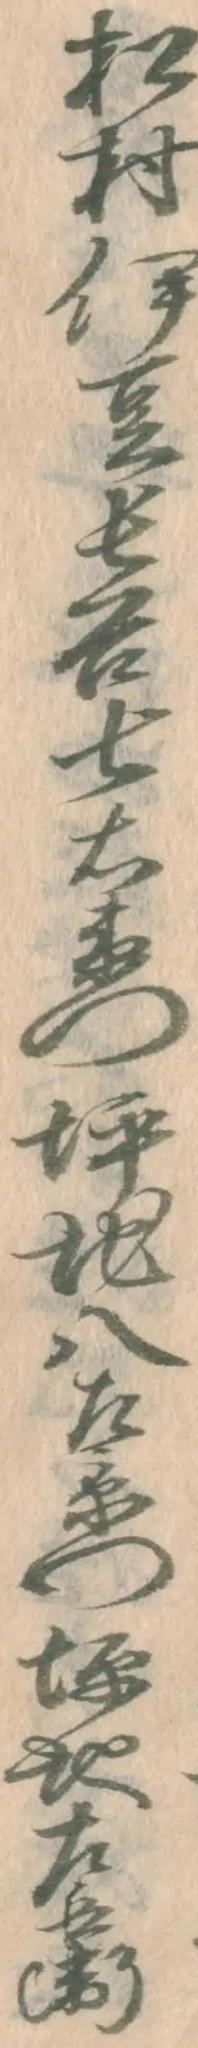松村伊豆長谷七右衛門坪地八左衛門堀地左兵衛

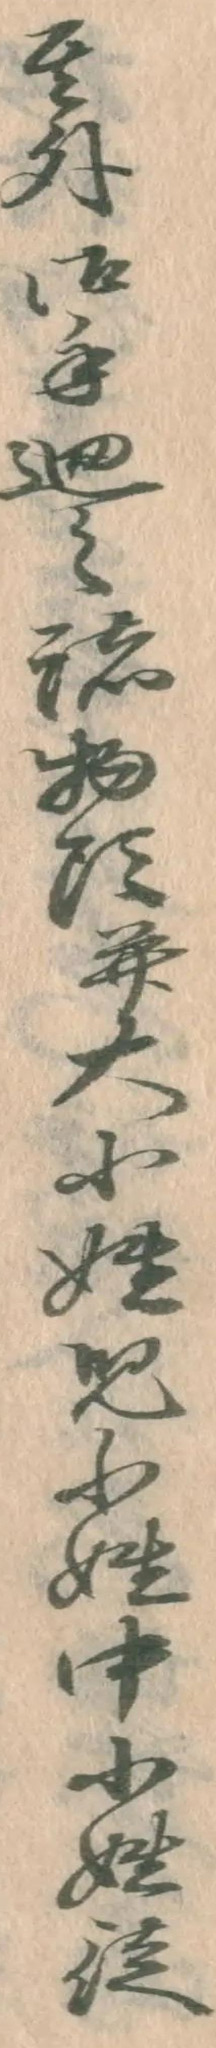其外御手廻之諸物頭幷大小姓児小姓中小姓徒
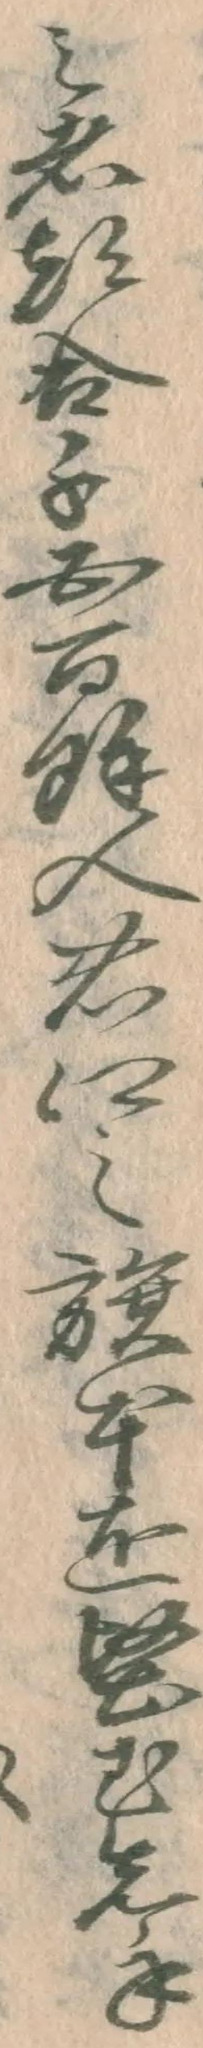之者都合千五百余人忠郷之旗本を堅む先手
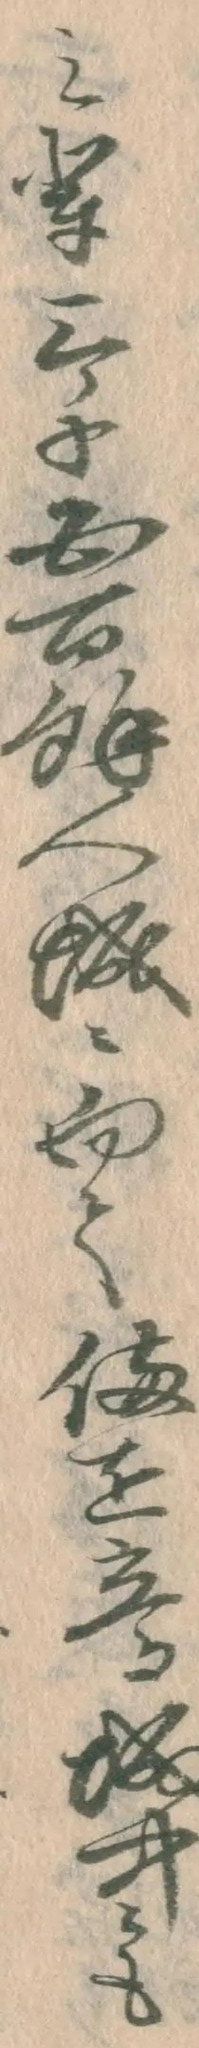之輩三千五百余人城に向て備を立る城中にも
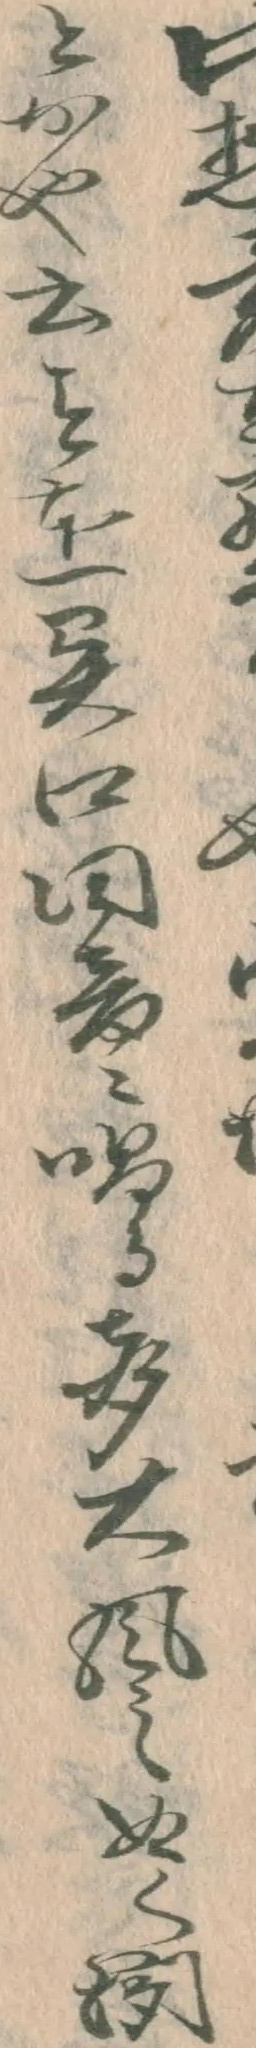とかや云ことを異口同音に唱る声大風之如く聞
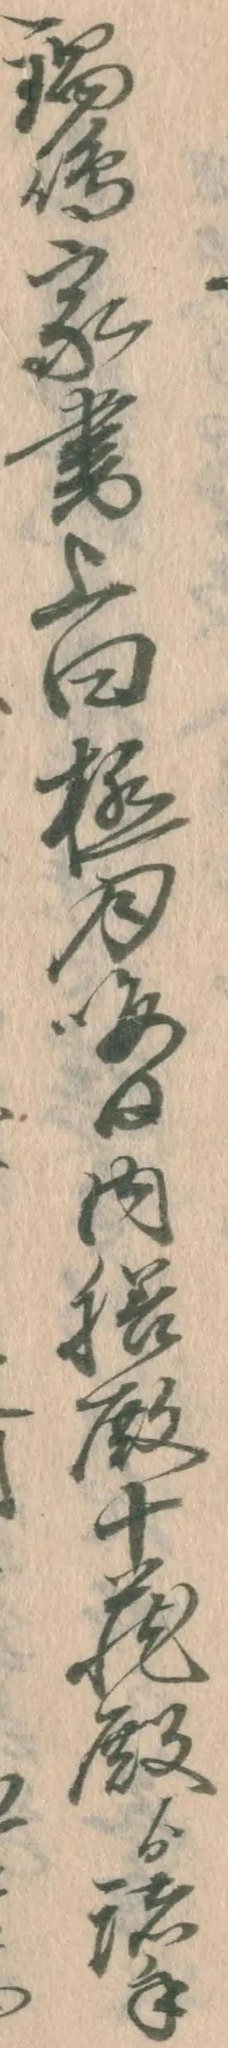鍋島家書上曰極月晦日内膳殿十蔵殿ゟ諸手
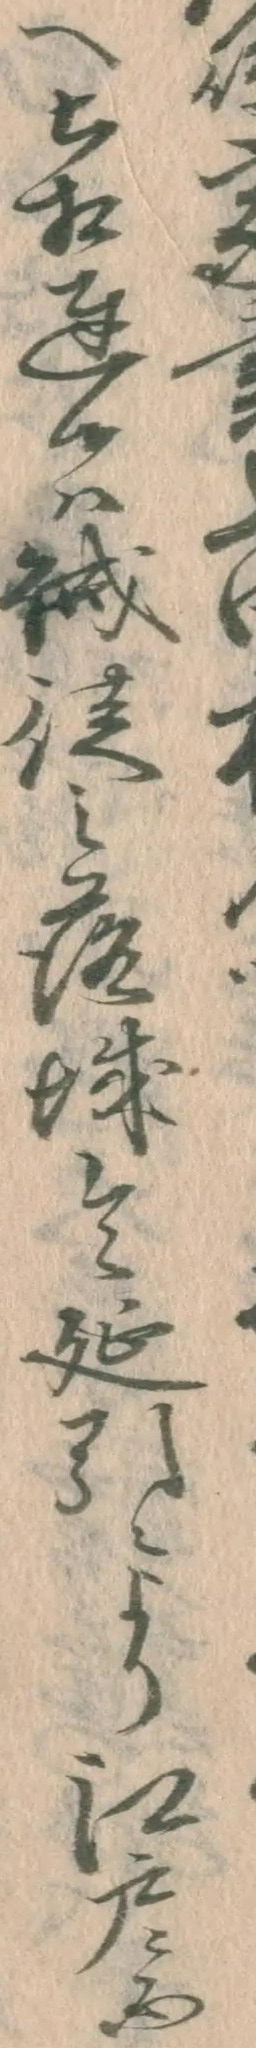へ被相達候は賊徒之落城今延引により江戸に而
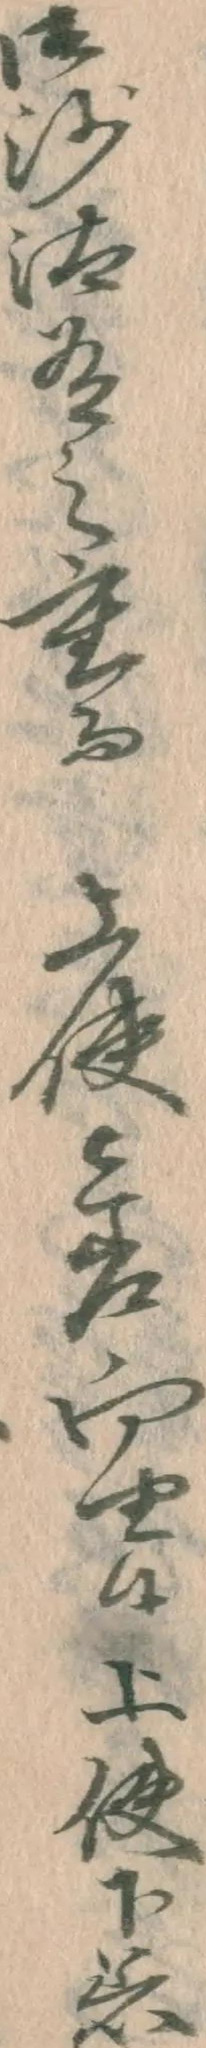御沙汰有之重而上使被差向由候上使下着
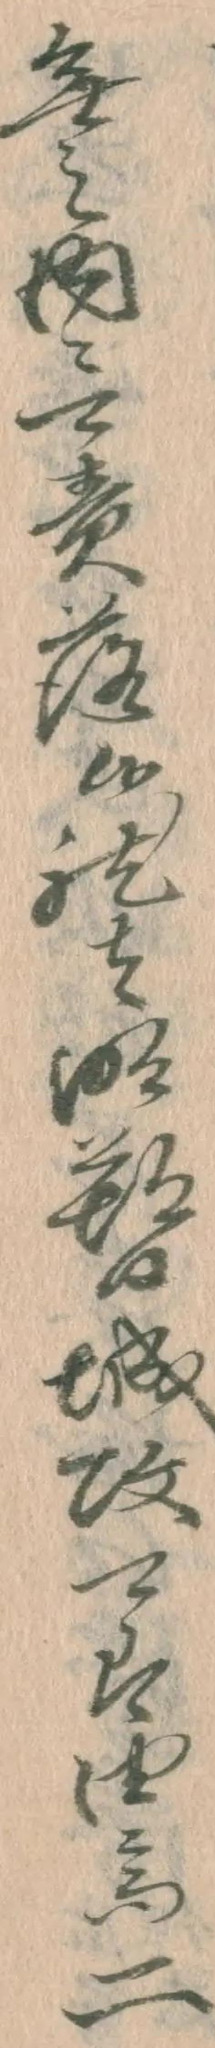無之内に可責落候然者明朔日城攻可望に而二
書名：切支丹御退治記 49巻. [5]
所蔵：国立国会図書館 National Diet Library, JAPAN
